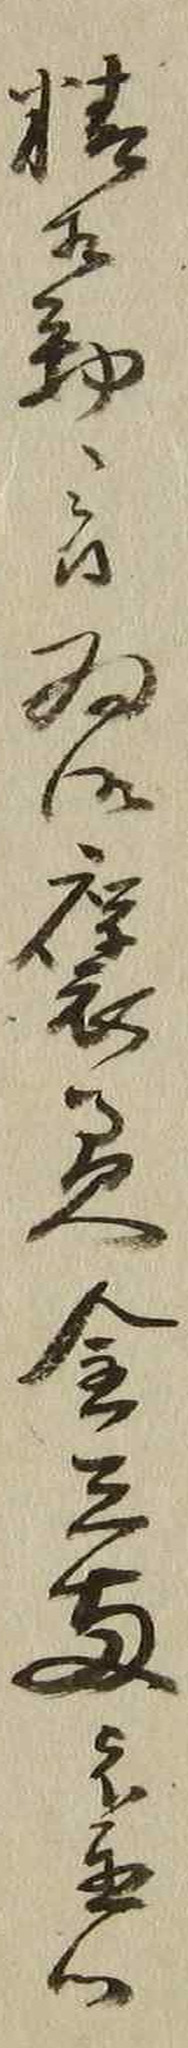精相勤候ニ付為御褒美金三両被下置候
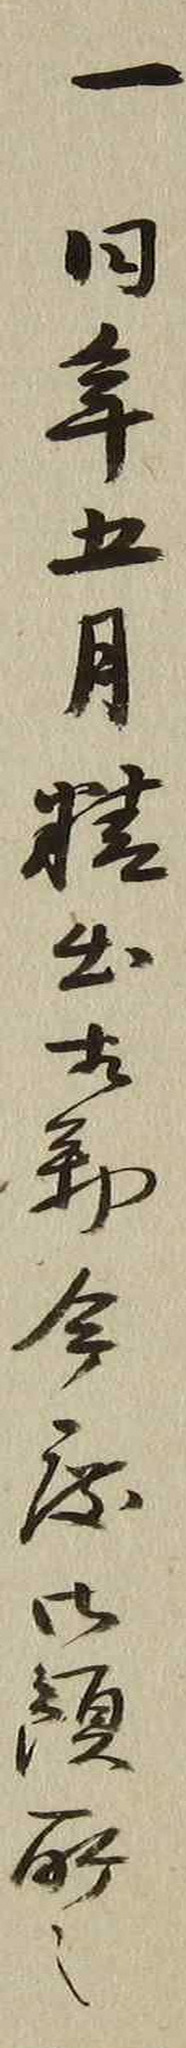一同年五月精出相勤今度御預所之
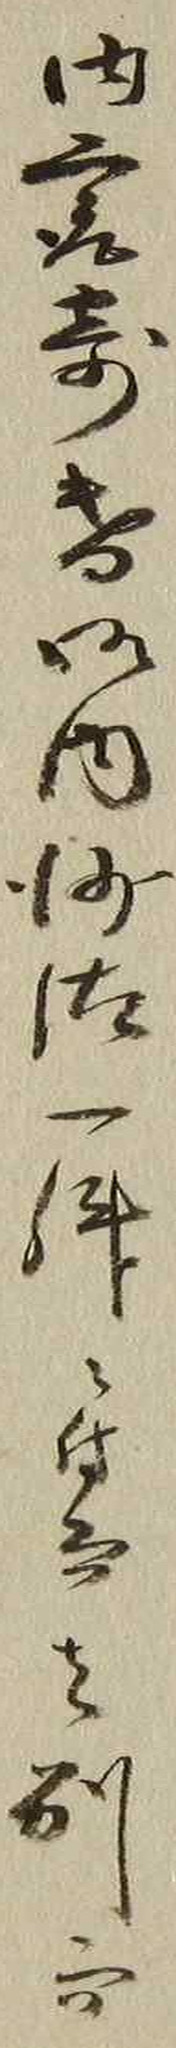内最寄替御内沙汰一件ニ付而者別而
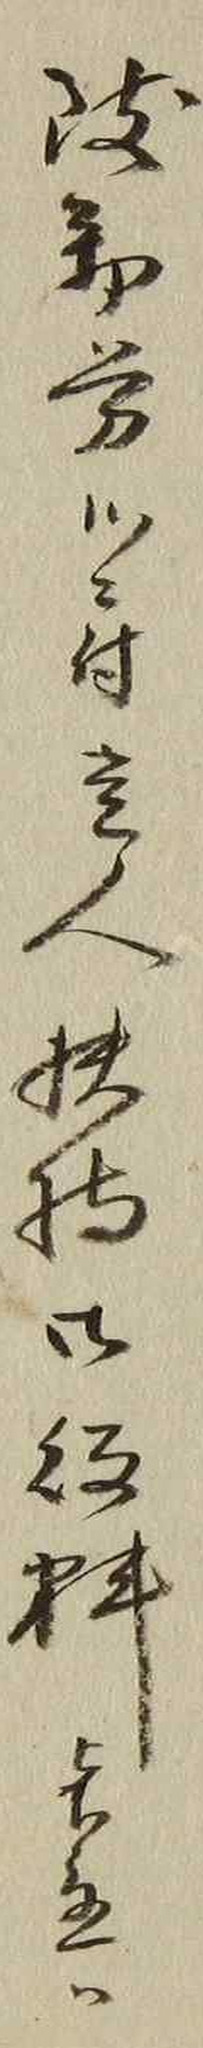致勤労候ニ付ニ壱人扶持御役料被下置候
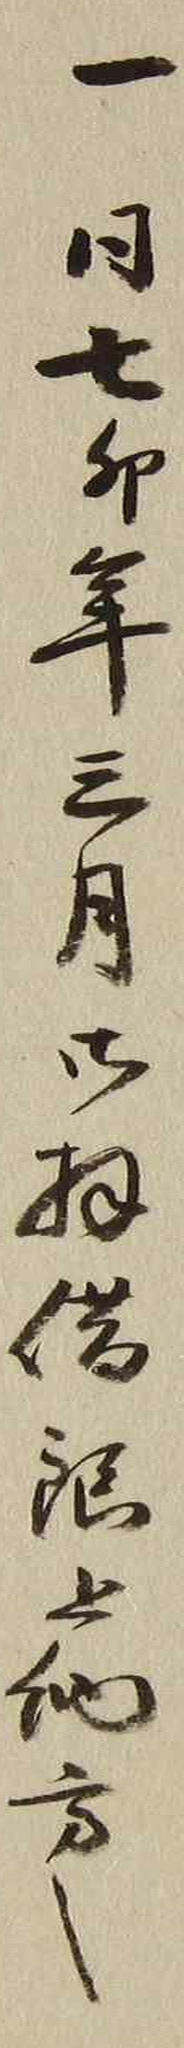一同七卯年三月御拝借銀上納方之
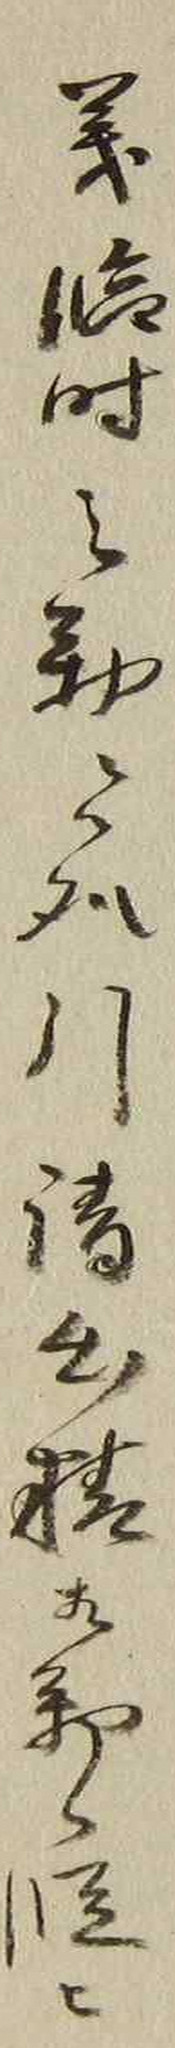義臨時之勤ニ候処引請出精相勤候段被
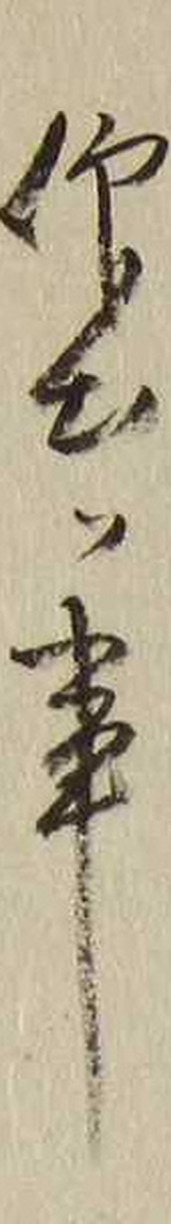仰出候事
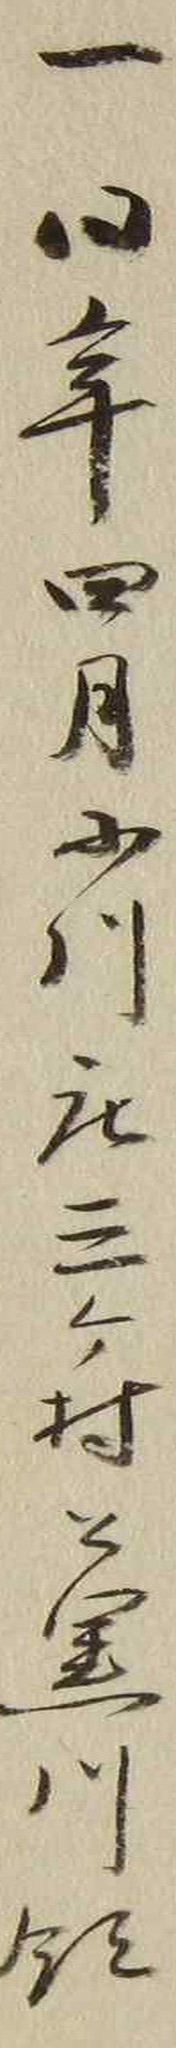一同年四月小川庄三ヶ村と黒川領
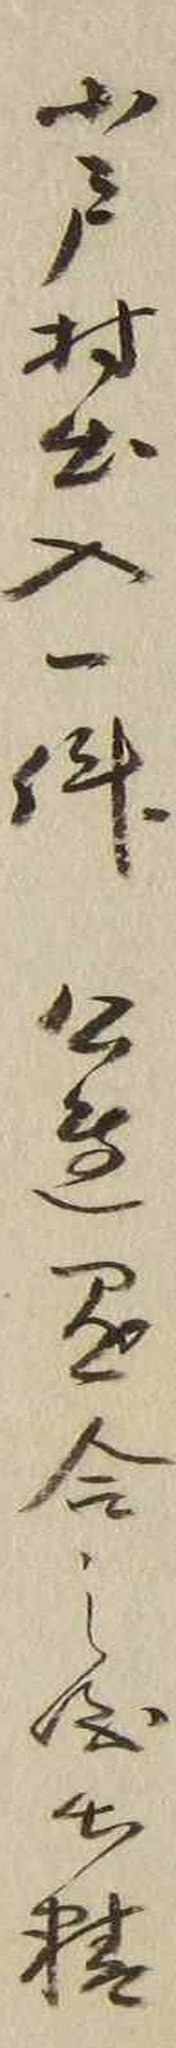小戸村出入件一公辺懸合之儀出精

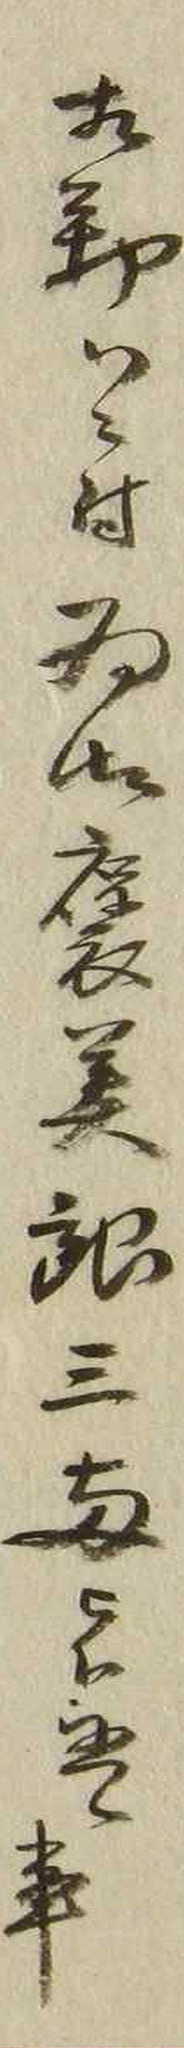相勤候ニ付為御褒美銀三両被下置候事
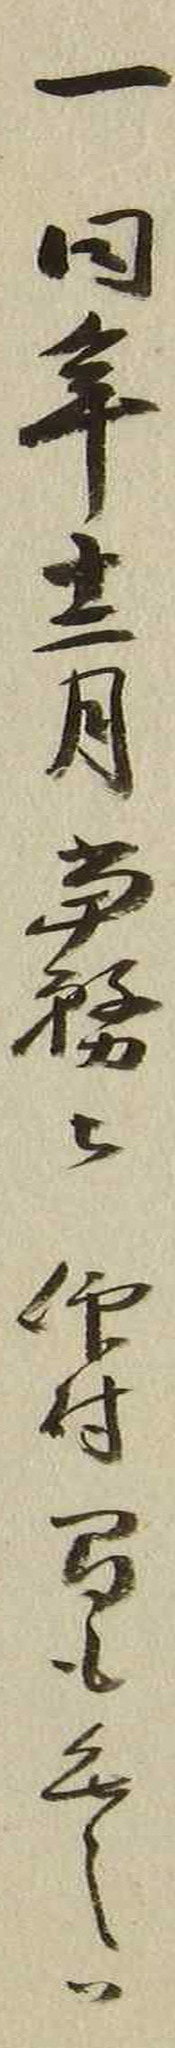一同年十二月当務被仰付間も無之候
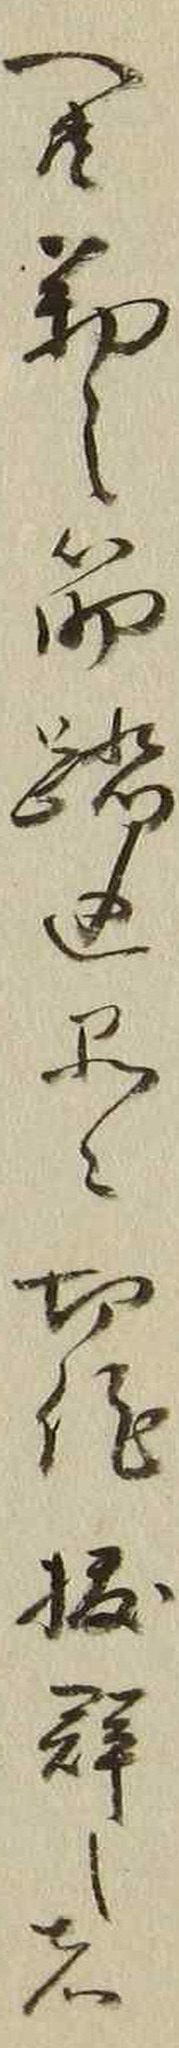へ共勤之筋踏込品々切作抜群之者
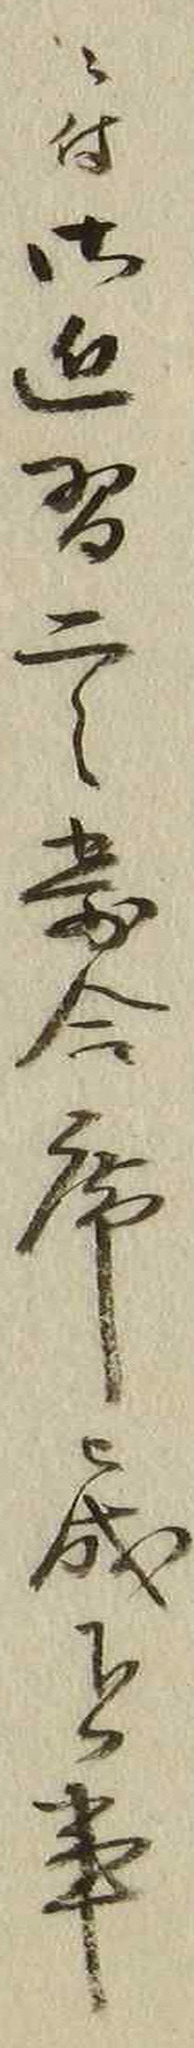ニ付御近習二之寄合席被成下候事
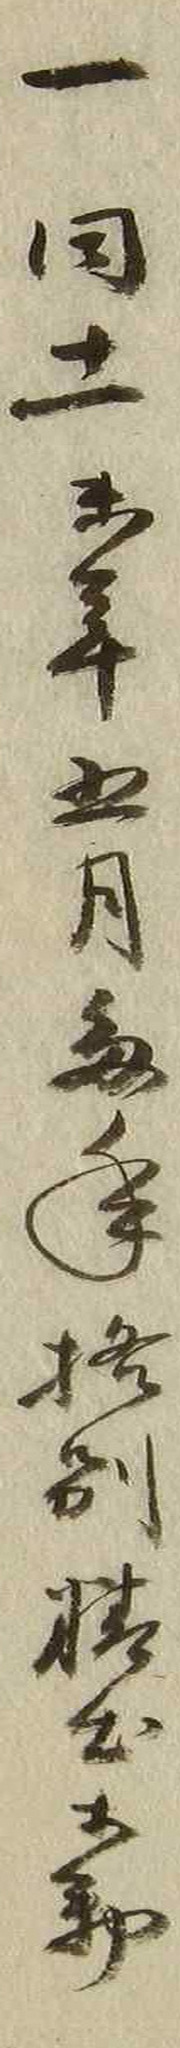一同十一未年五月多年格別精出相勤
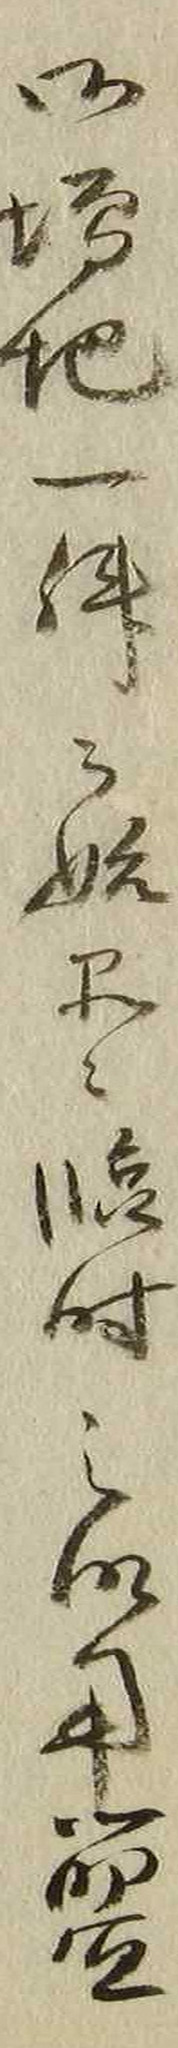御増地一件ヲ始品々臨時之御用筋宜
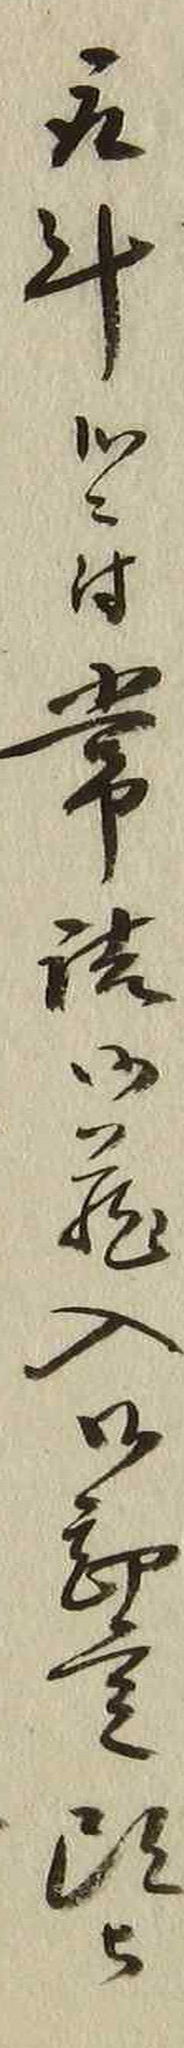取計候ニ付常詰御蔵入御勘定頭被
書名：諸士系譜　巻之236　ふ之部4
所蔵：会津若松市立会津図書館
